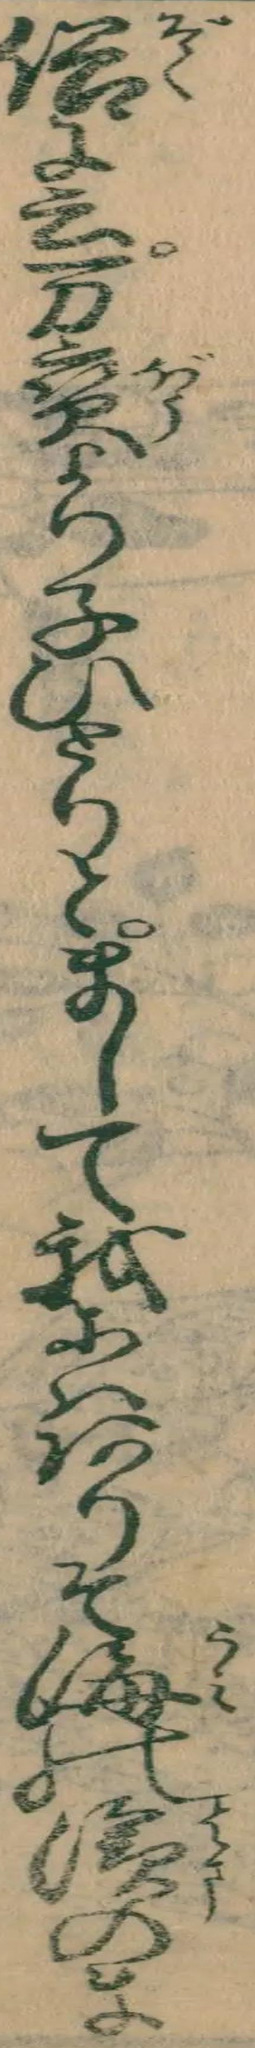俗に云。万宝より子ひとりと。まして我等はありそ海の浜のま
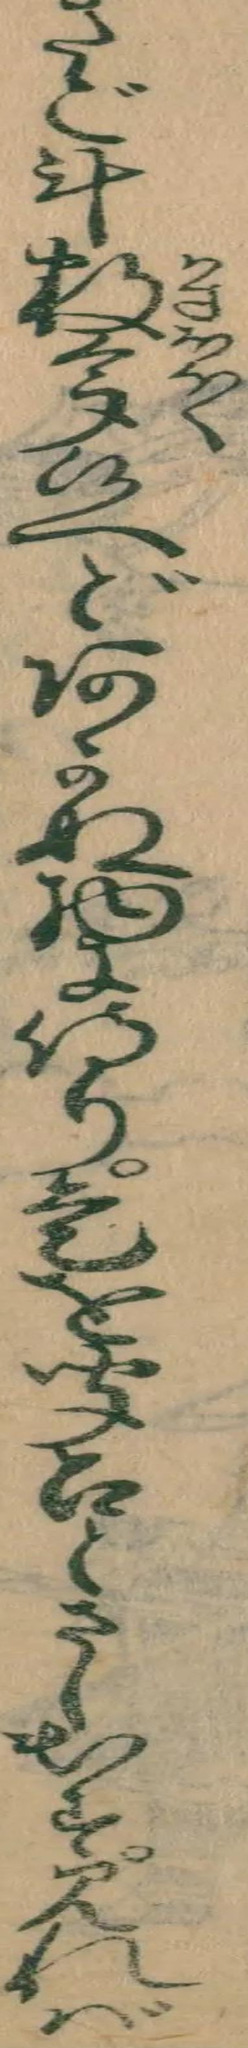さご計数多候へどあかぬ物に侍り。是を聞召とさし出す。見れば
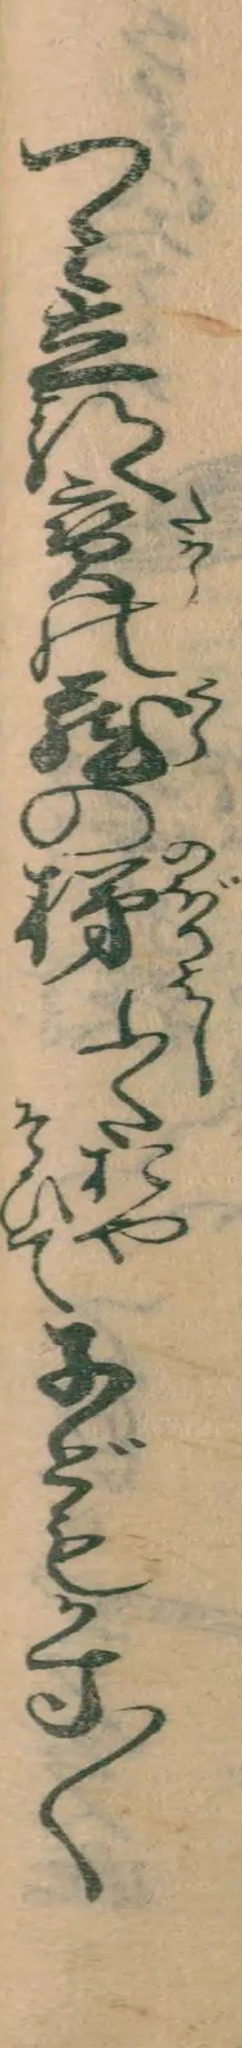つみ立る宝の蔵の梯ふたおやそひて子どもかす〳〵
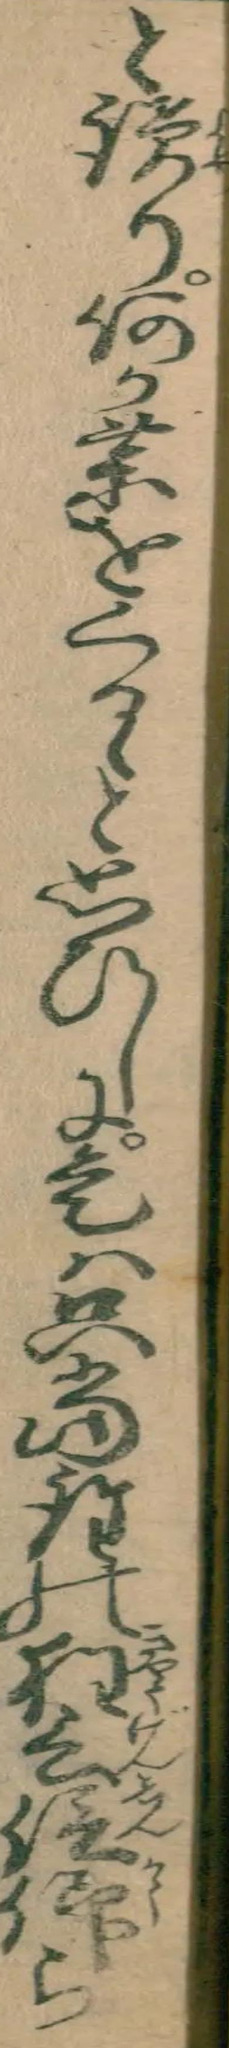と読り。何か薬をくるゝと思ひしに。是は只当座の狂言信仰ら
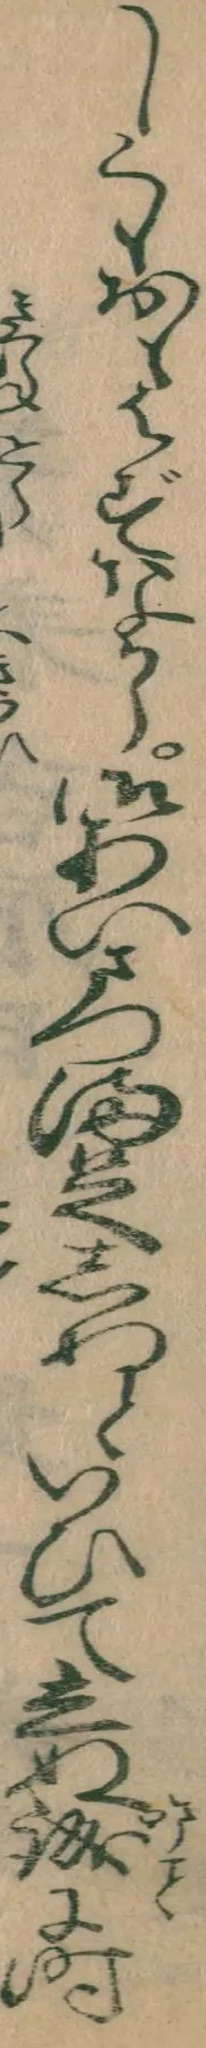しくもおもはずなから。御あいさつ満足しぬといひて立ぬ。誠に時
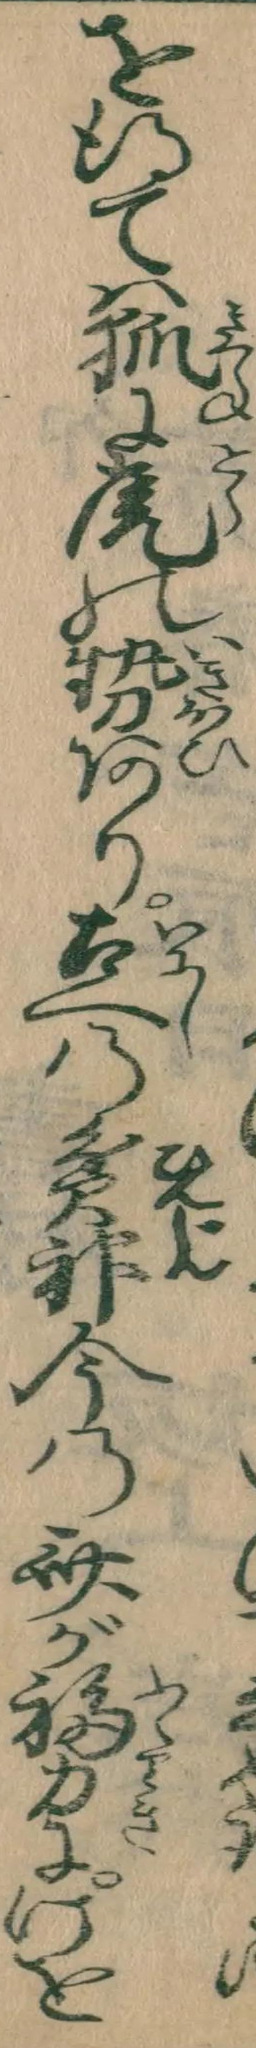を得ては狐に虎の勢あり。古への貧神今の斎が福力に。けを
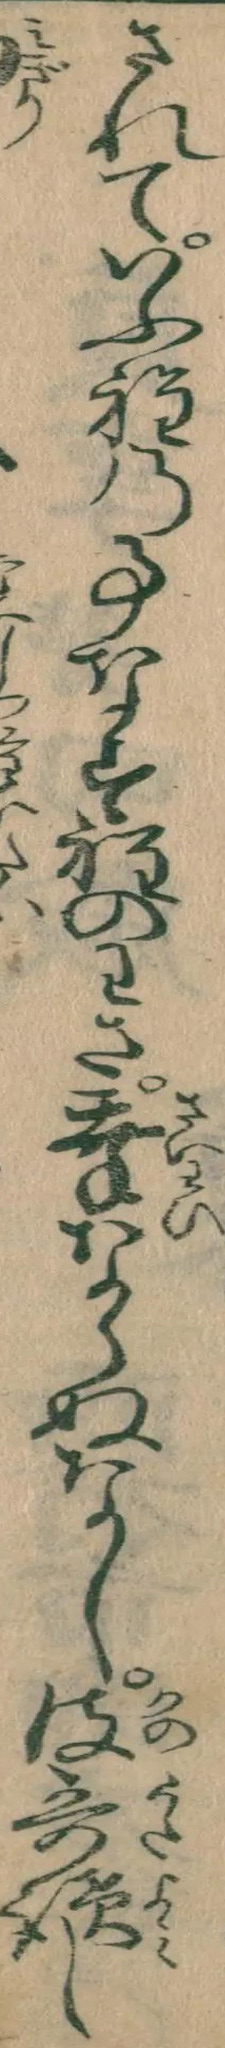されて。いふ程の事なす程のわさ。幸ならぬなし。彼歌読し
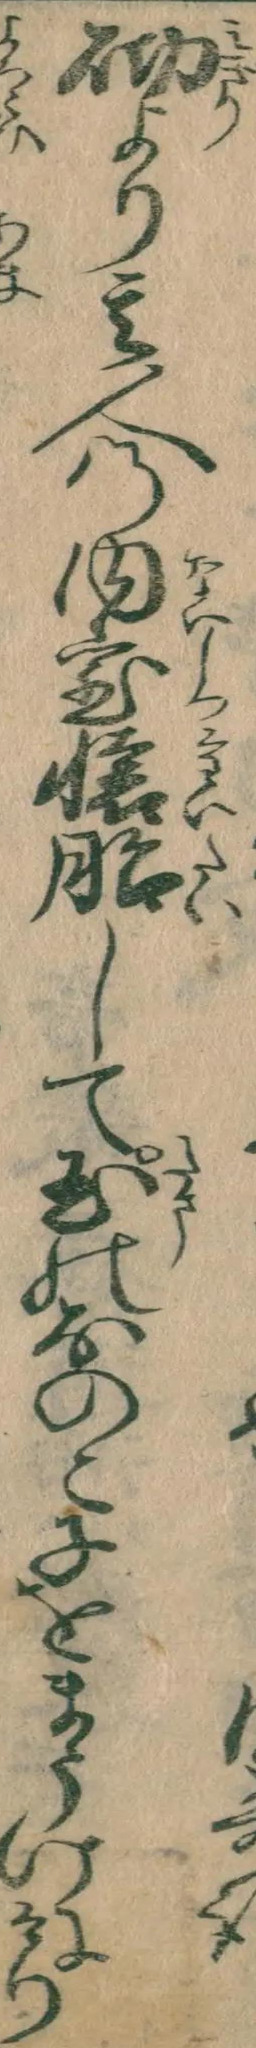砌より其人の内室懐胎して。玉のおのこ子をまうけにけり
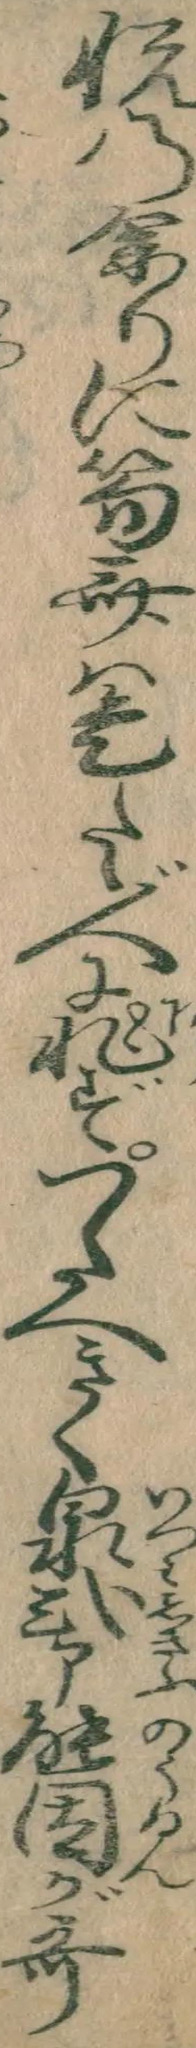悦の余りに筍斎は是たゞ人に非ず。つたへきく泉式部能因が歌
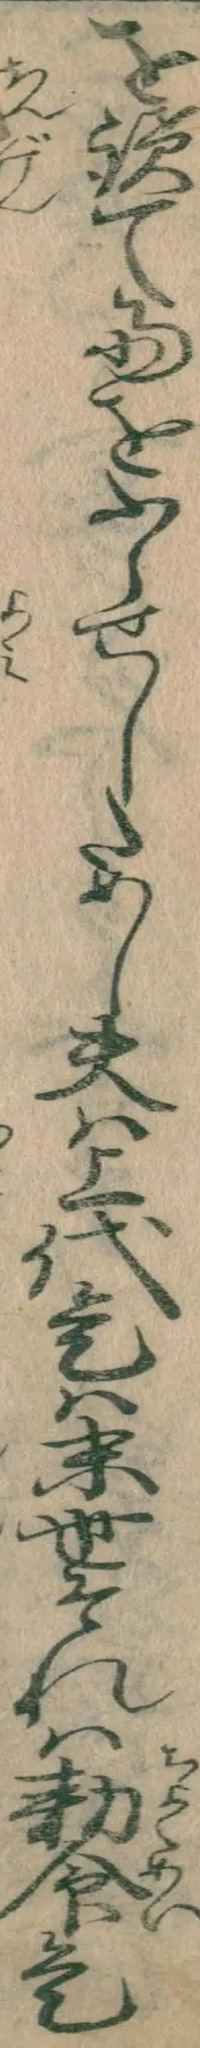を読て雨をふらせしためし夫は上代是は来世それは勅命是
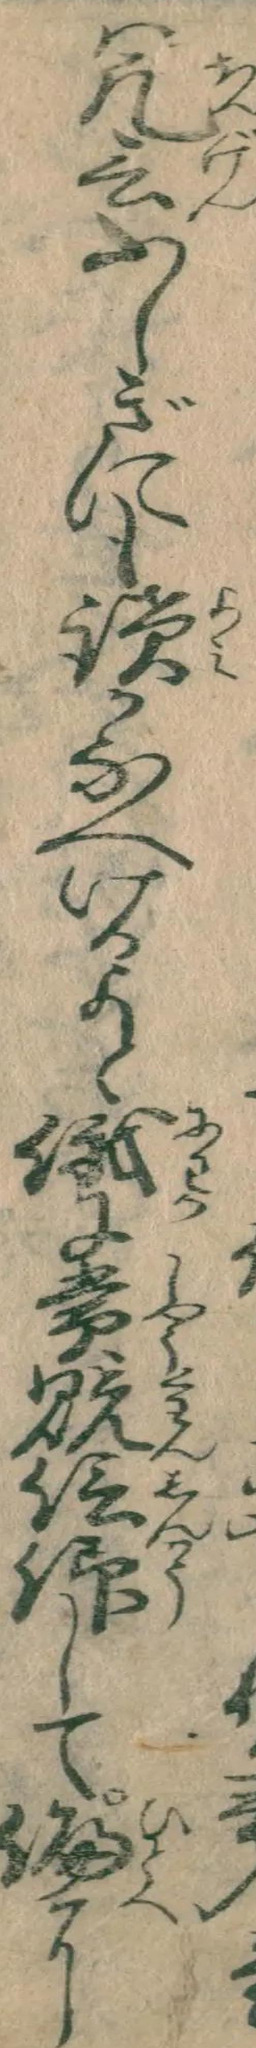は凡言ふしぎにも読かなへけるよと俄に賞翫信仰して。偏に
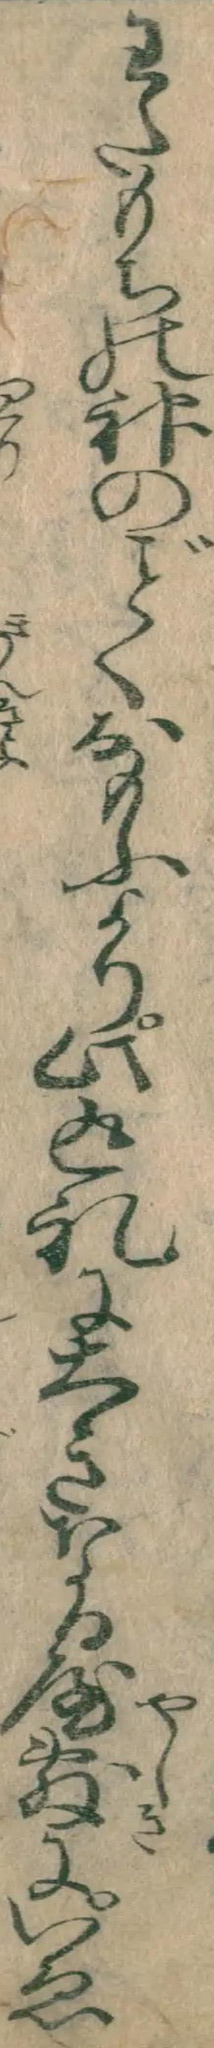わたもちの神のごとくおもふより。此返礼に大きなる屋敷に。いゑ
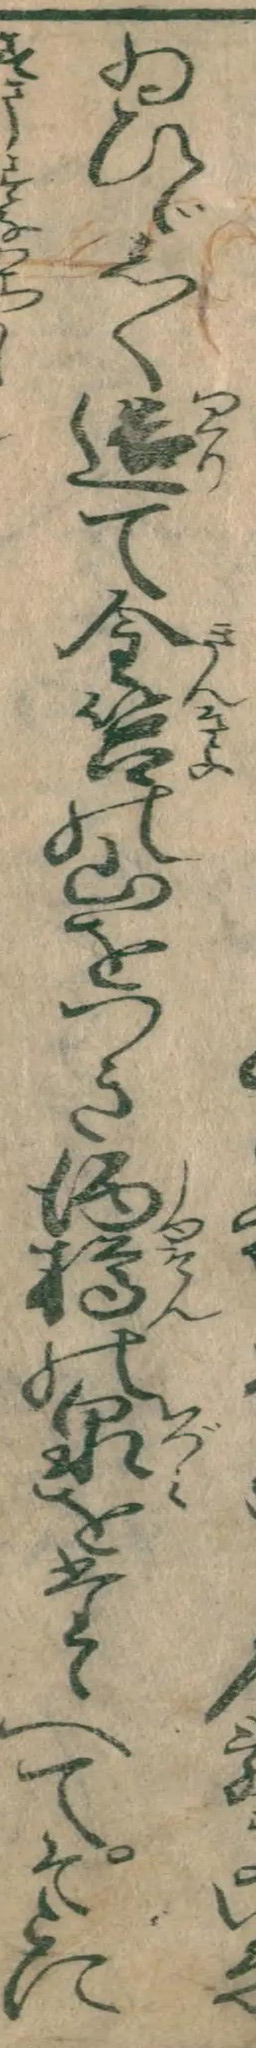ゐひゞし〱造て金筥の山をつき酒樽の泉をたゝへて。そこに
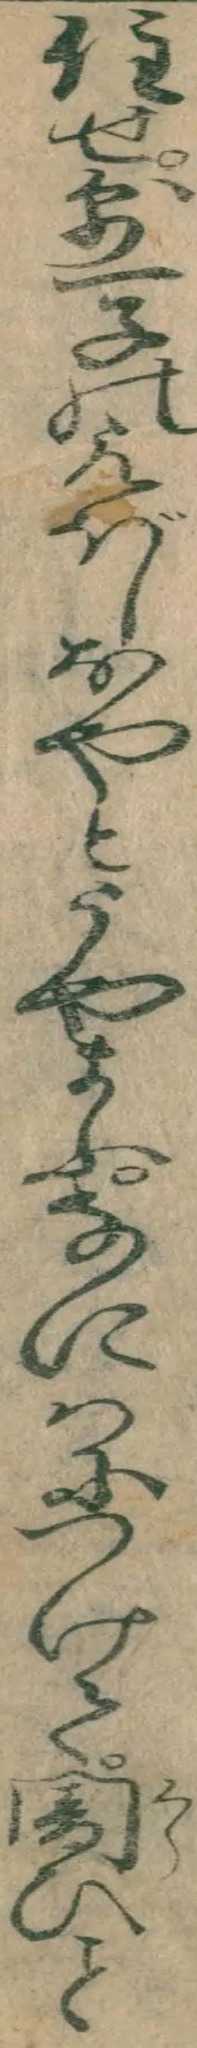住せ。則一子のえぼしおやとうやまふ。なにかにつけて。闇ひこと

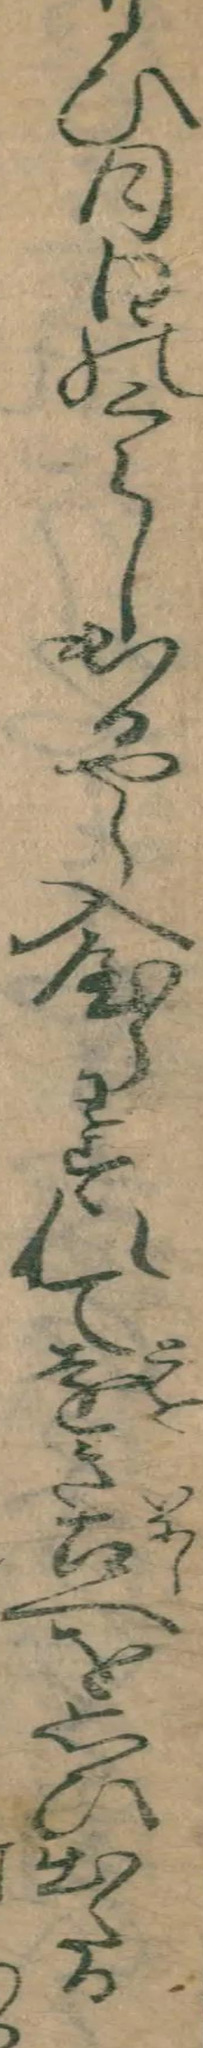なひ月日のくらし出るやら入やらわすれて遠き古へを思ひ出たる時よめる
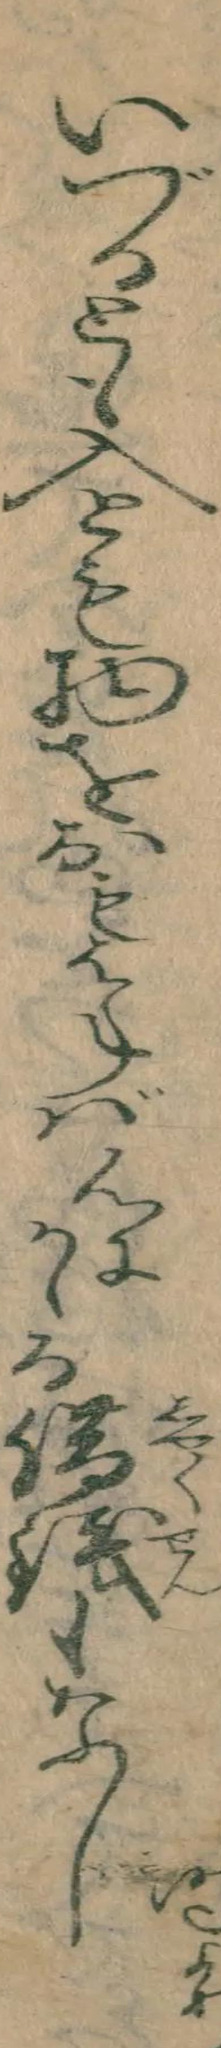いづるとも入とも物をおもはねば心にかゝる借銭もなし
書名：新竹斎 5巻
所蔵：国立国会図書館 National Diet Library, JAPAN
